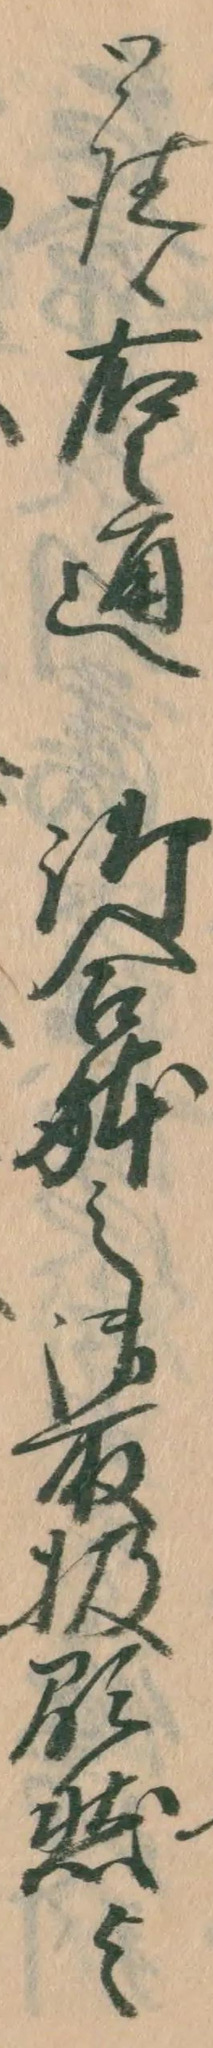御座候右之通御合躰之御取扱顕然と
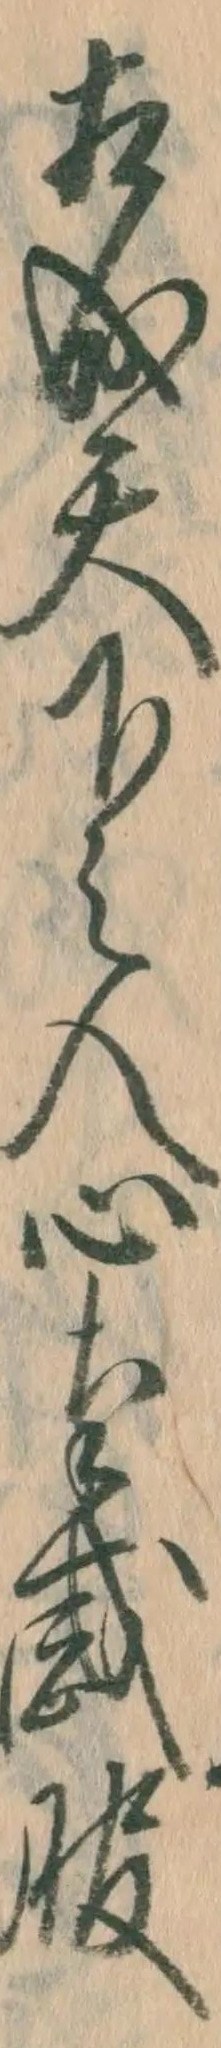相成天下之人心奉感服
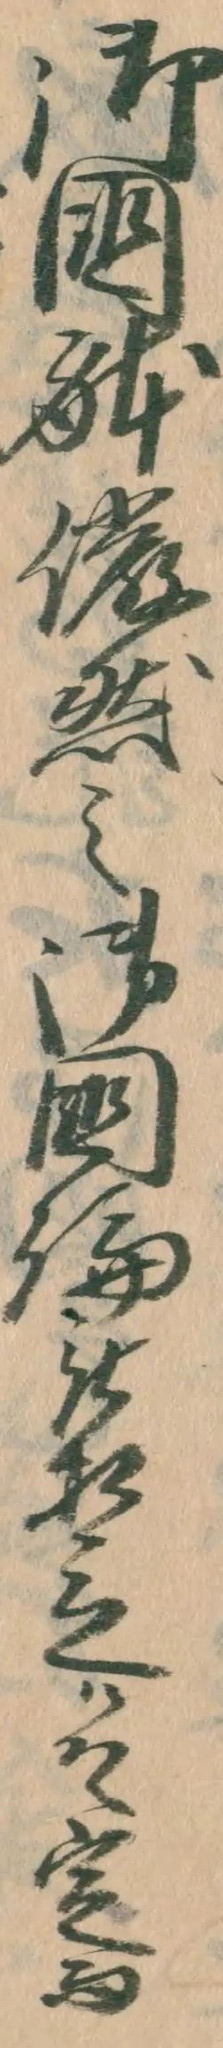御国躰儼然之御国論被相立候ハゝ定而
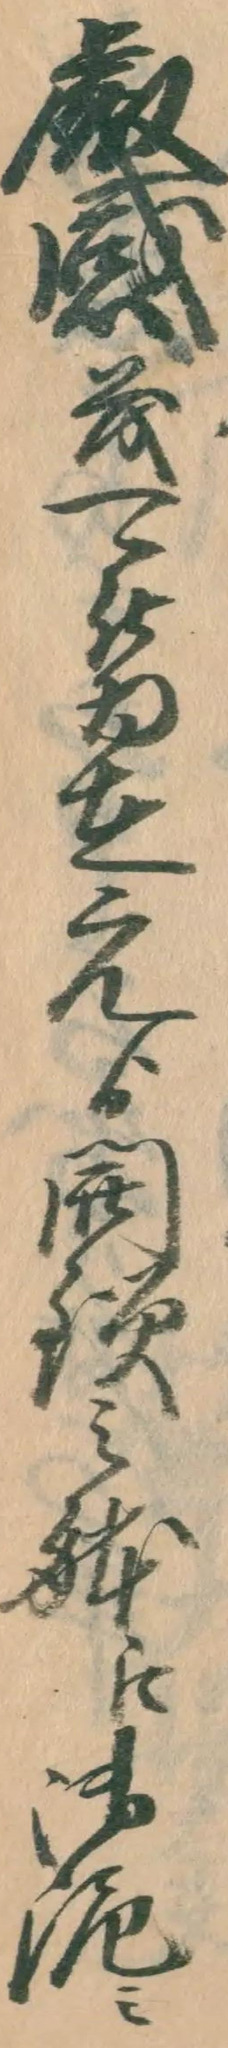叡感も可被為在元より開鎖之躰え御泥ミ

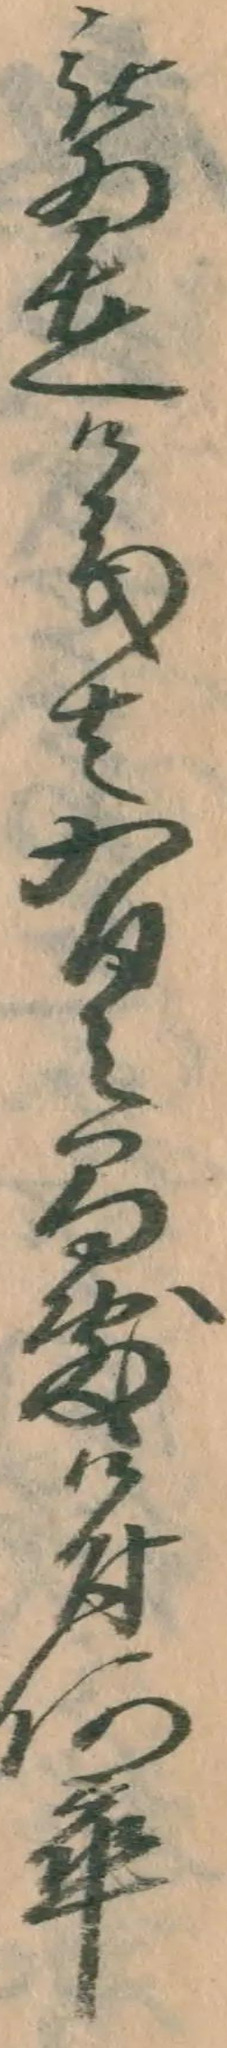被為在候義者有之間敷候付何卒
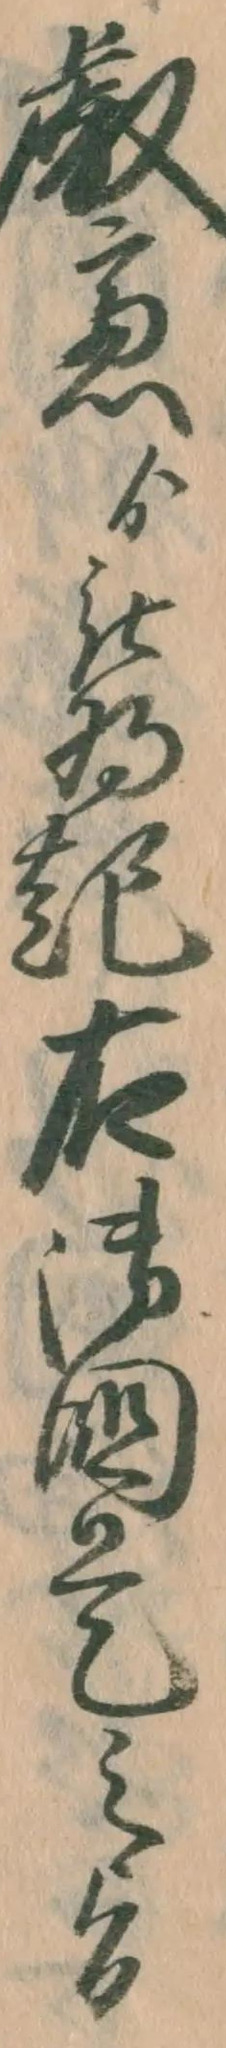叡慮より被為起右御国是之旨
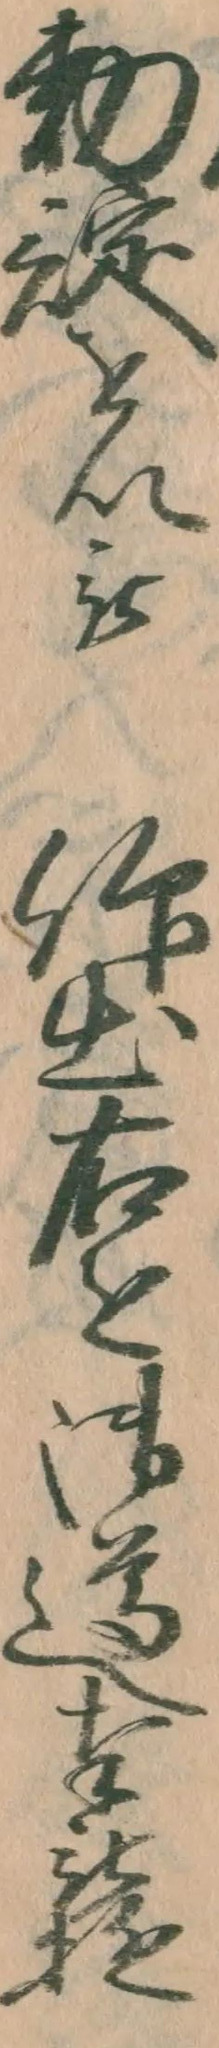勅諚を以被仰出右を御遵奉被遊
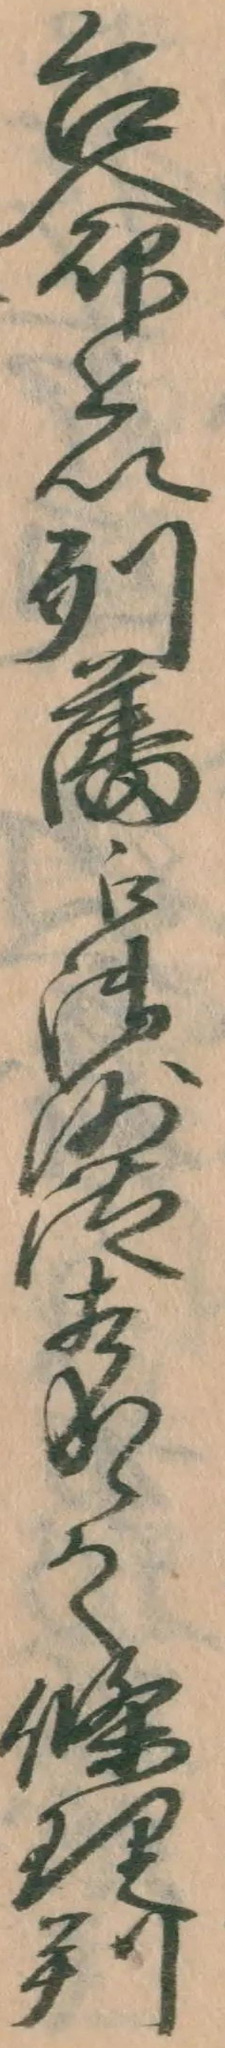台命を以て列藩え御沙汰相成候ハゝ條理判
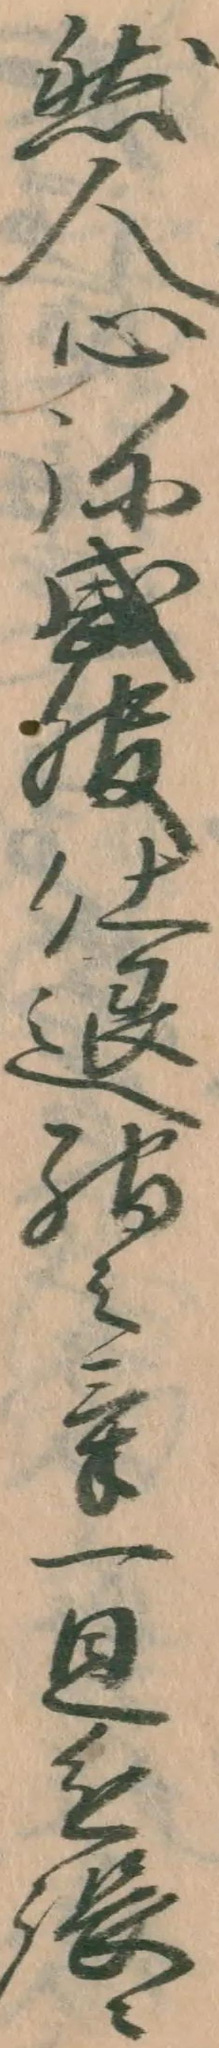然人心弥感服仕退縮之氣一旦進張二
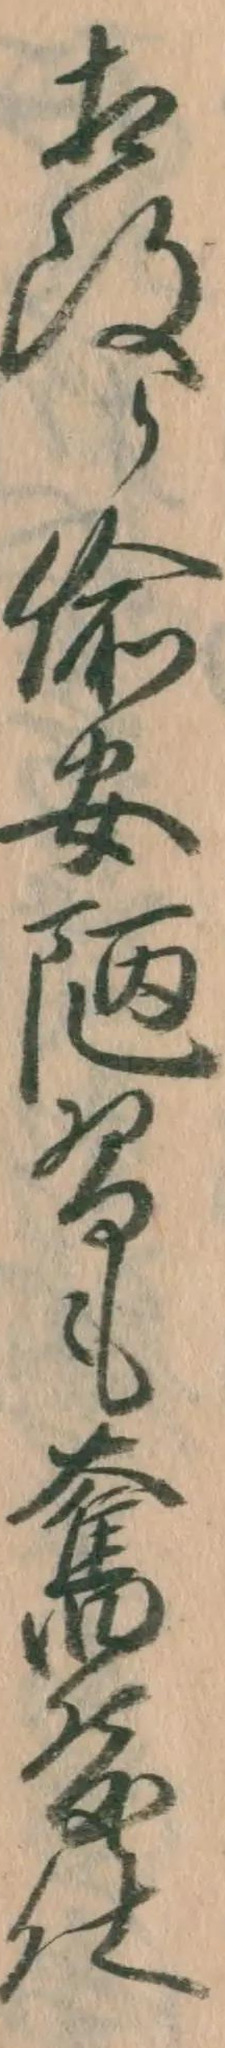相改り偸安陋習も奮発仕
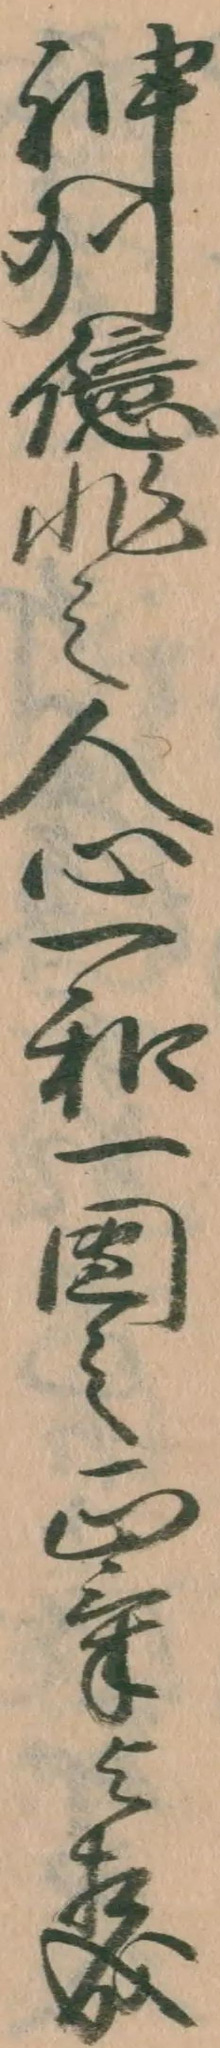神州億兆之人心一和一團之正氣と相成
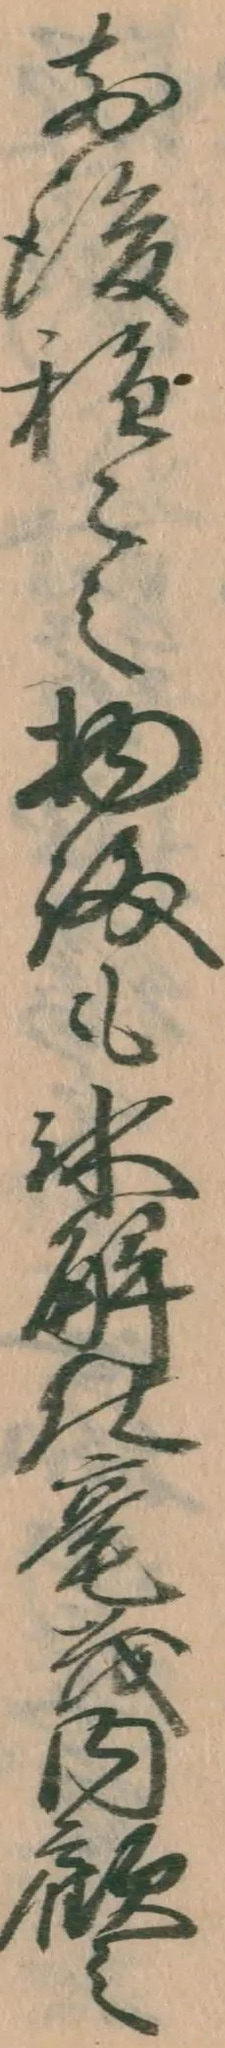前後種々之物議も氷解仕毫も内顧之
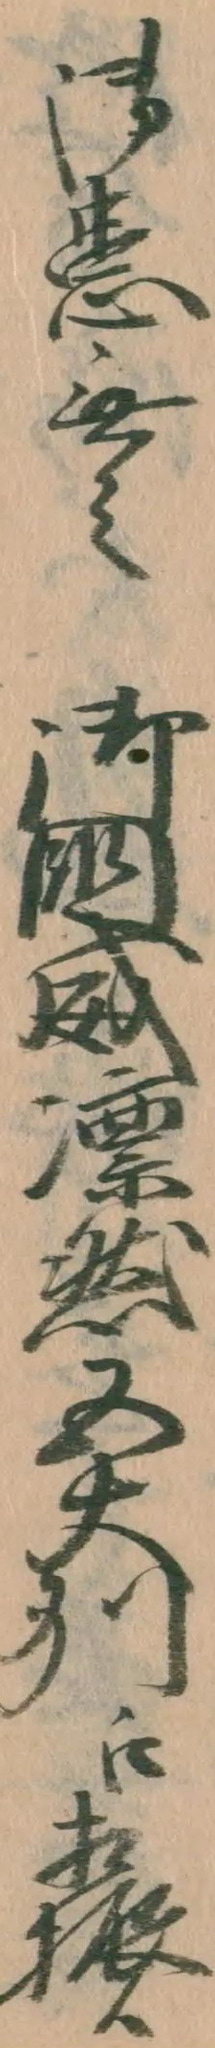御患無之御国威凛然五大州え相振候
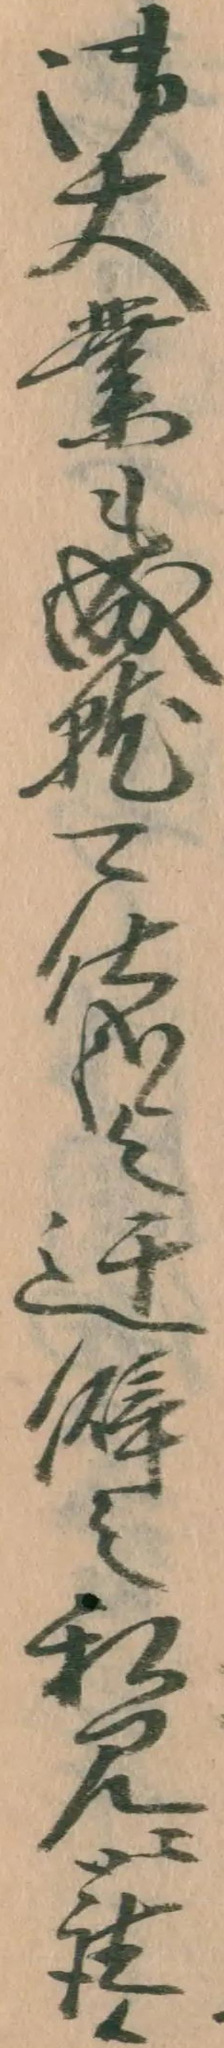御大業も成就可仕哉と迂僻之私見二御座候
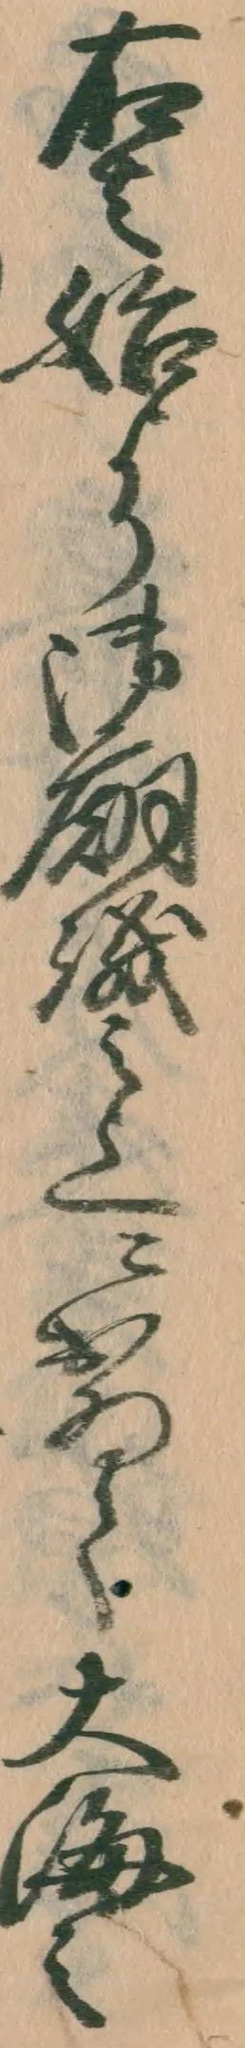右者始より御廟議之上ニ出為に大海之
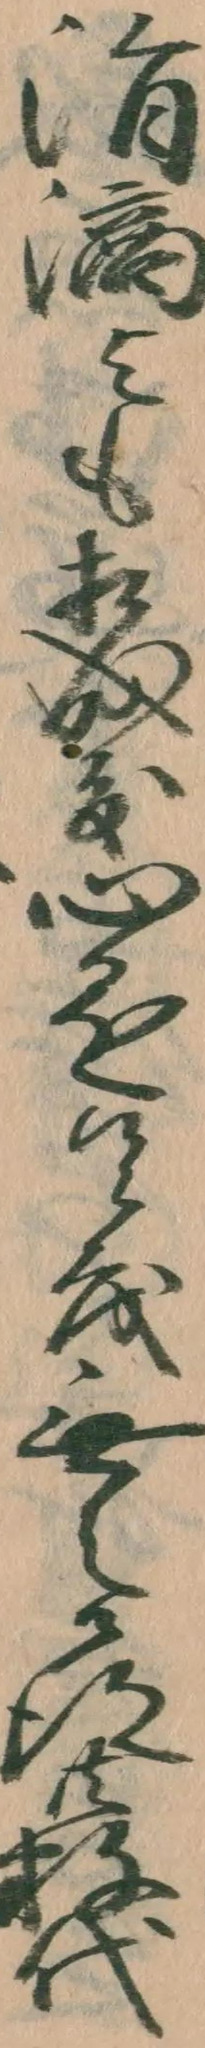消滴とも相成度心懸候も無之候得共数代
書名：麗斎叢書. 20
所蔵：国立国会図書館 National Diet Library, JAPAN
